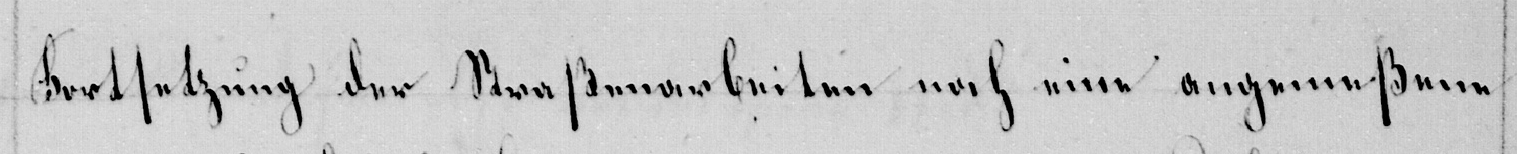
Fortsetzung der Straßenarbeiten noch eine angemeßene
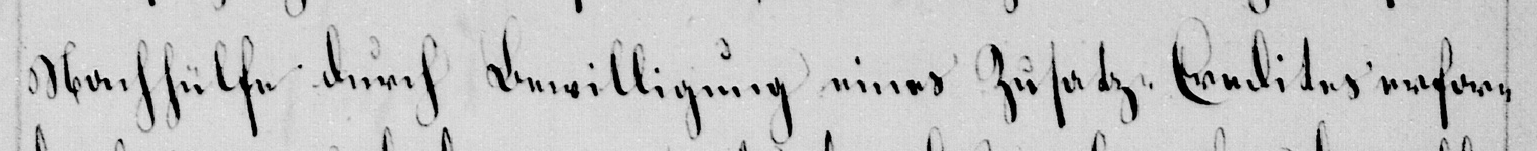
Nachhülfe durch Bewilligung eines Zusatz-Credites erfor¬
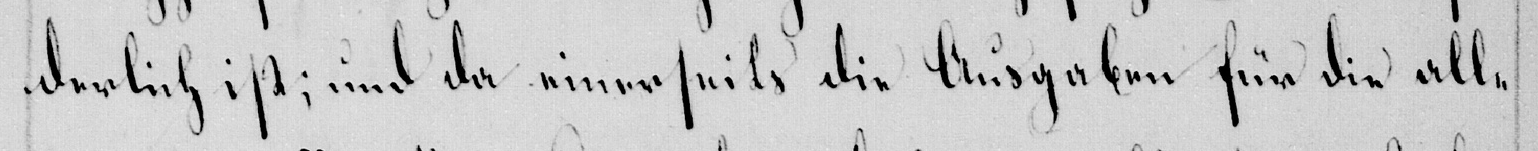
derlich ist; und da einerseits die Ausgaben für die all¬
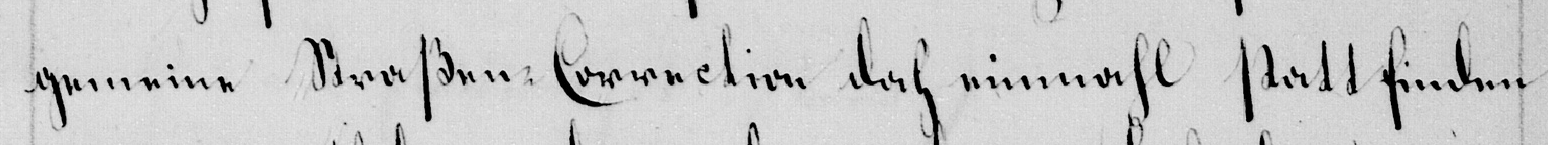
gemeine Straßen-Correction doch einmahl statt finden
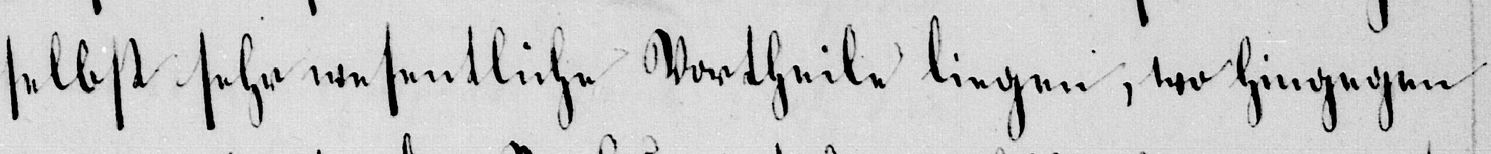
selbst sehr wesentliche Vortheile liegen, wo hingegen
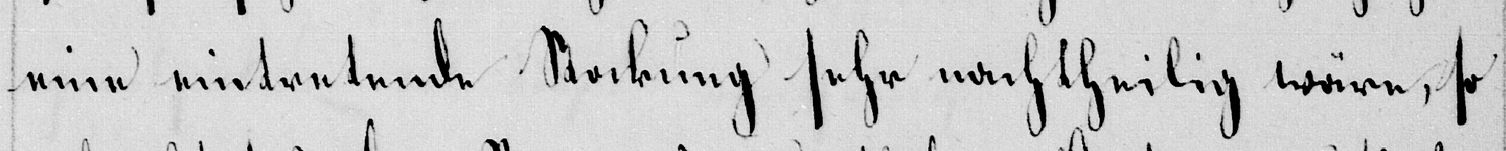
eine eintretende Stockung sehr nachtheilig wäre, so
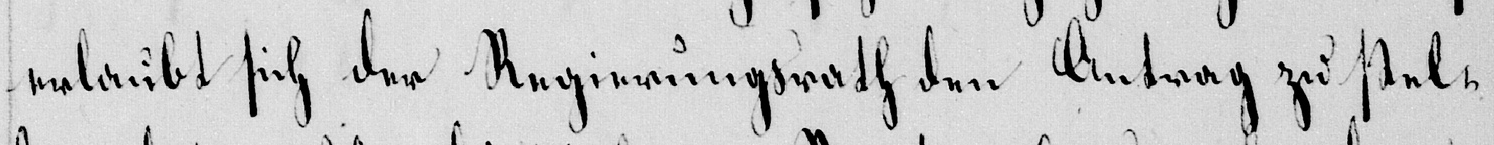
erlaubt sich der Regierungsrath den Antrag zu stel¬
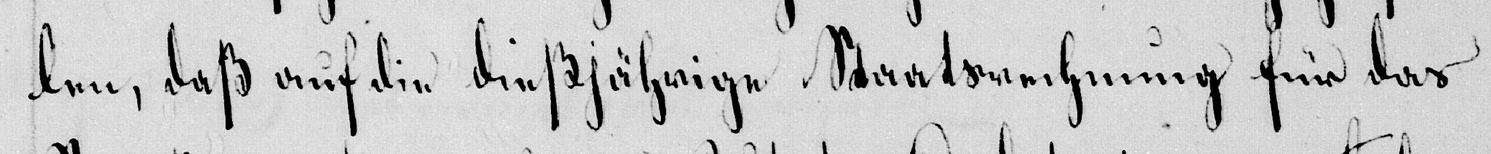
len, daß auf die dießjährige Staatsrechnung für das
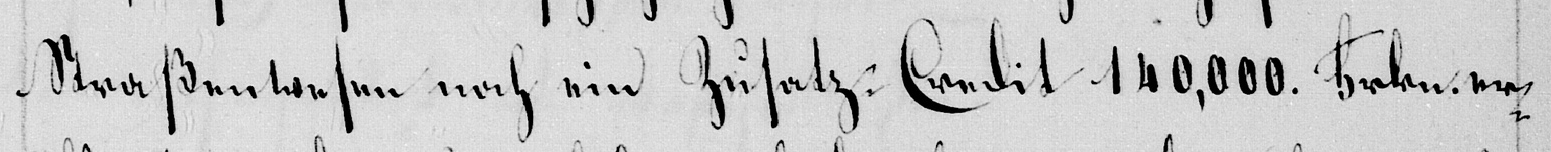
Straßenwesen noch ein Zusatz-Credit 140,000. Frkn. er¬
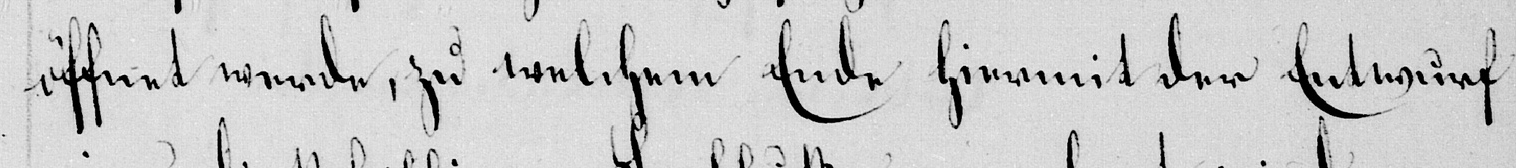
öffnet werde, zu welchem Ende hiermit der Entwurf
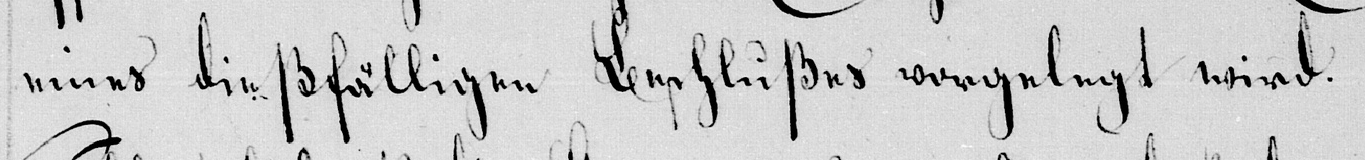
eines dießfälligen Beschlußes vorgelegt wird.
